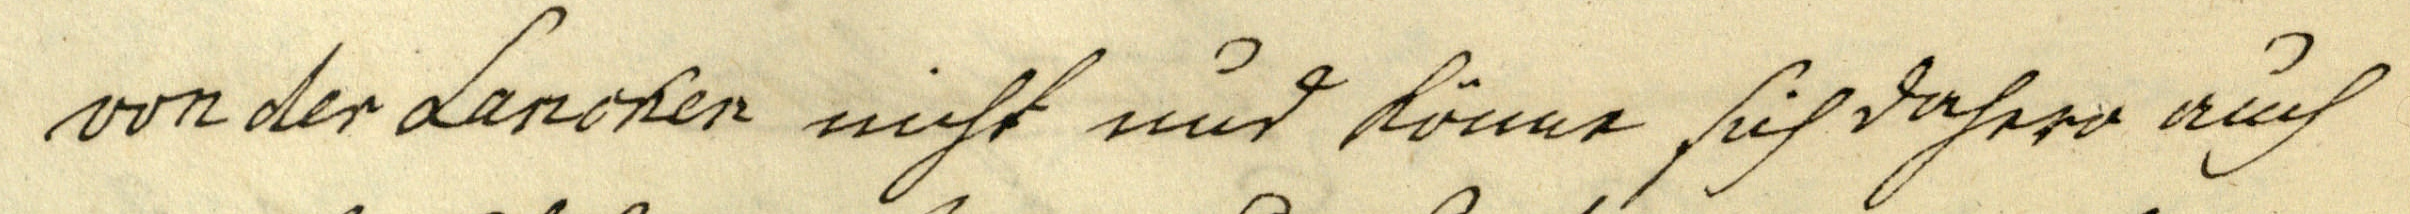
von der Lancken nicht und könne sich dahero auch
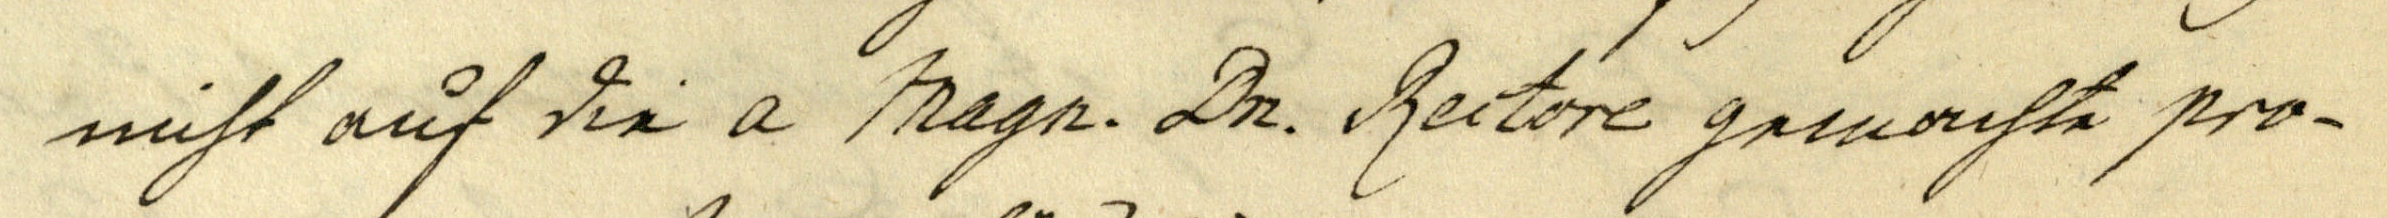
nicht auf die a Magn. Dn. Rectore gemachte pro-
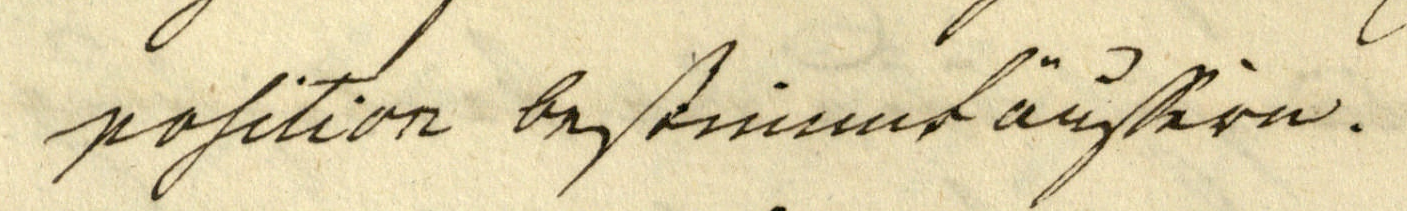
position bestimmt äussern.
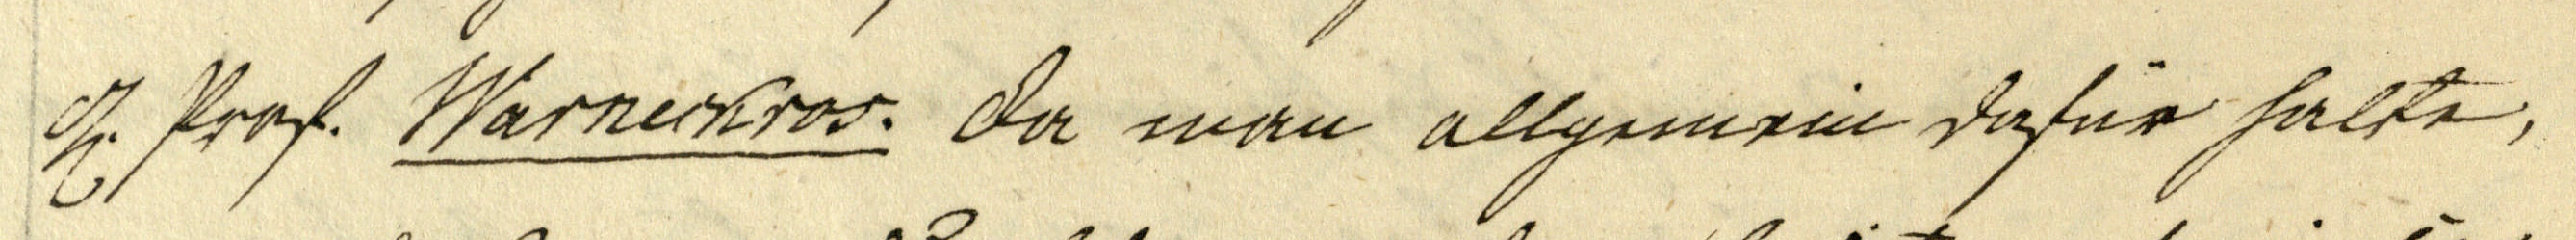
dh. Prof. Warneckros. Da man allgemein dafür halte,
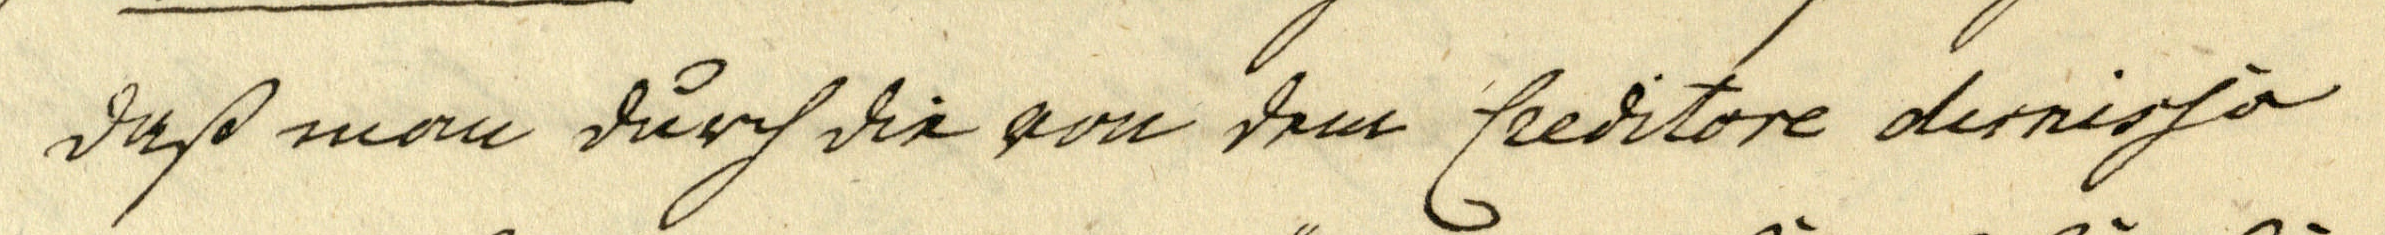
daß man durch die von dem Creditore demisso
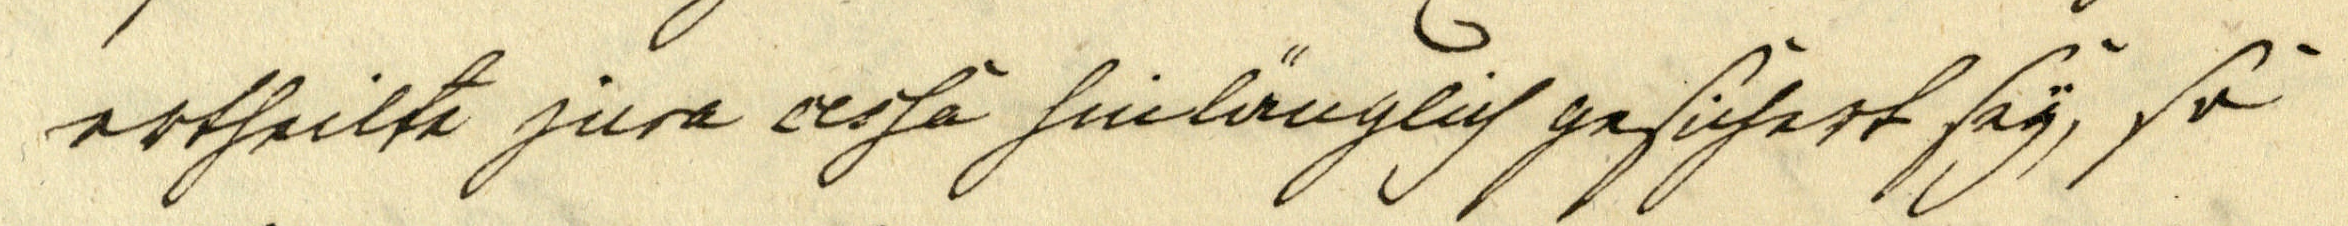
ertheilte jura cessa hinlänglich gesichert sey, so
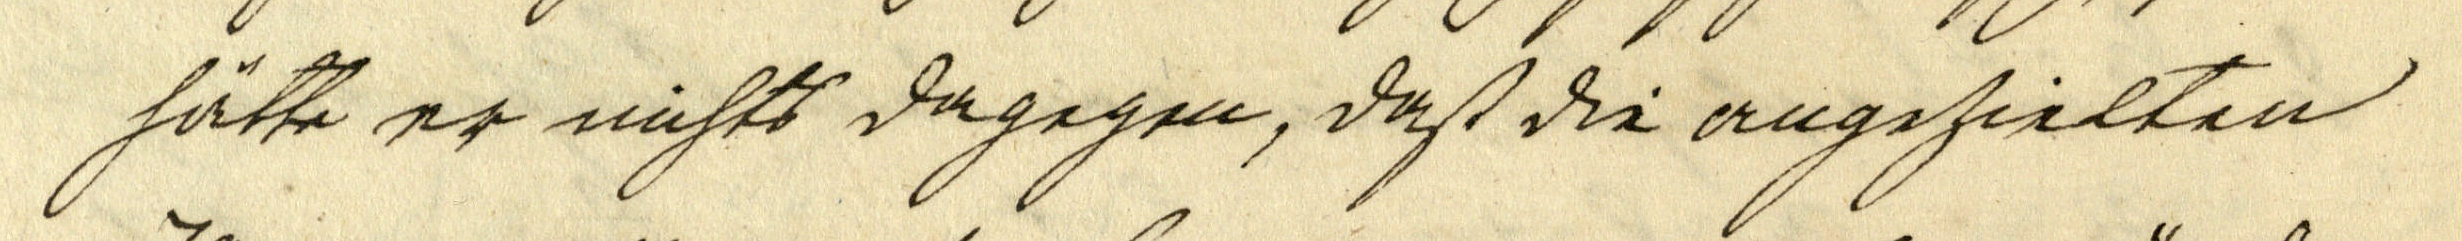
hätte er nichts dagegen, daß die angezielten
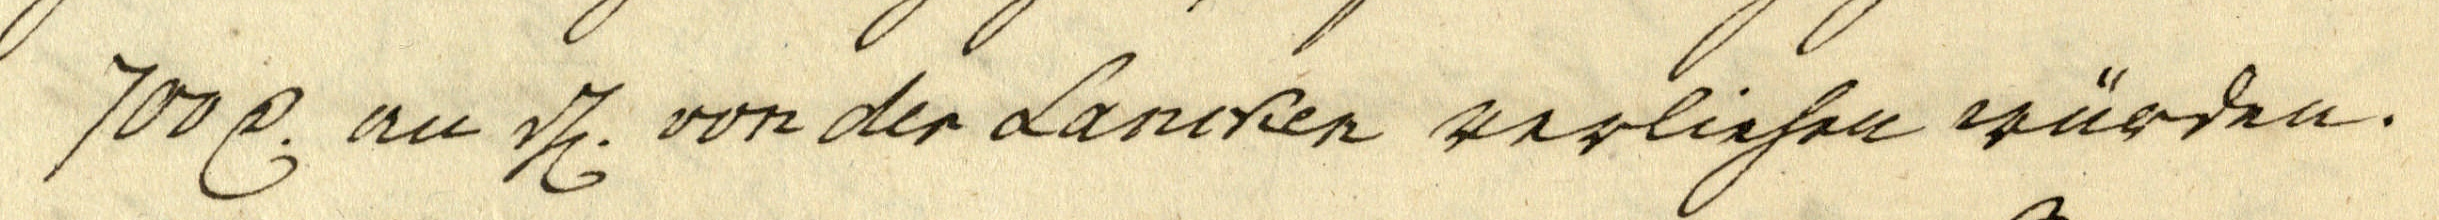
700 rtl. an dh. von der Lancken verliehen würden.
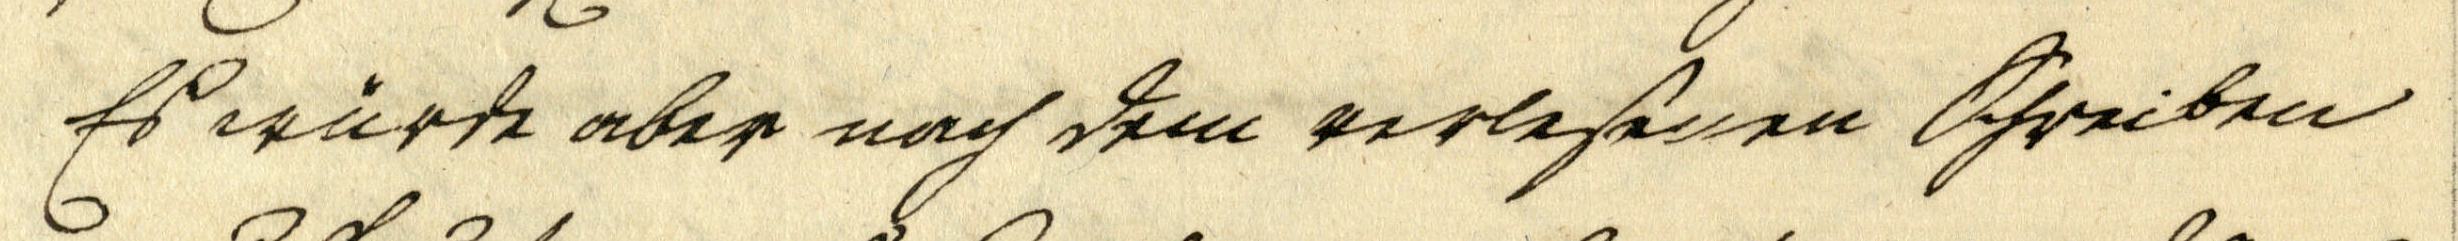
Es würde aber nach dem verlesenen Schreiben
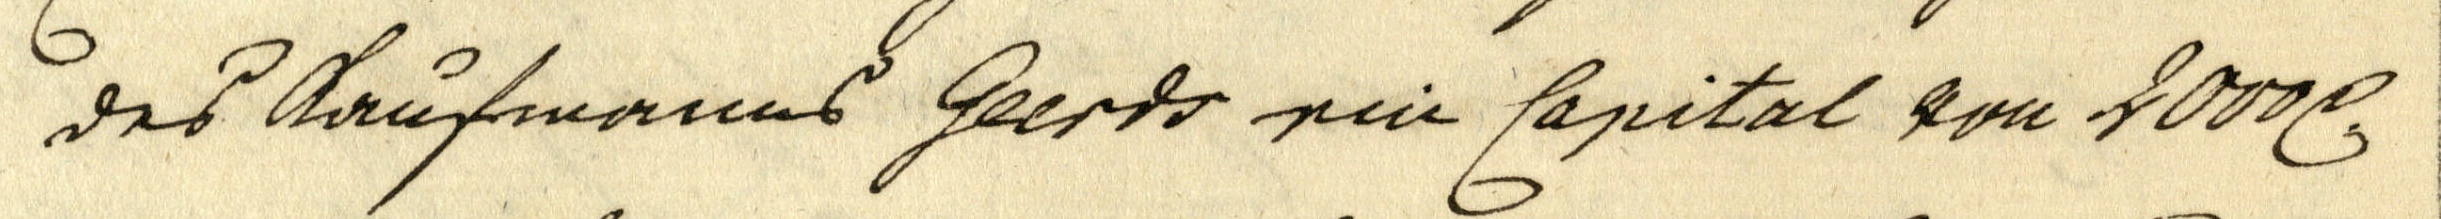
des Kaufmanns Geerds ein Capital von 2000 rtl.
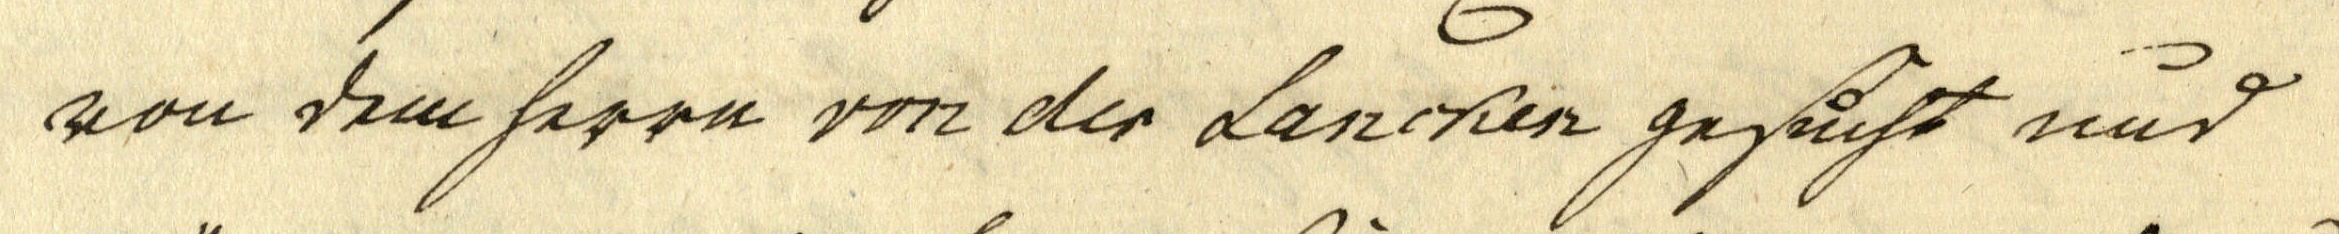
von dem herrn von der Lancken gesucht und
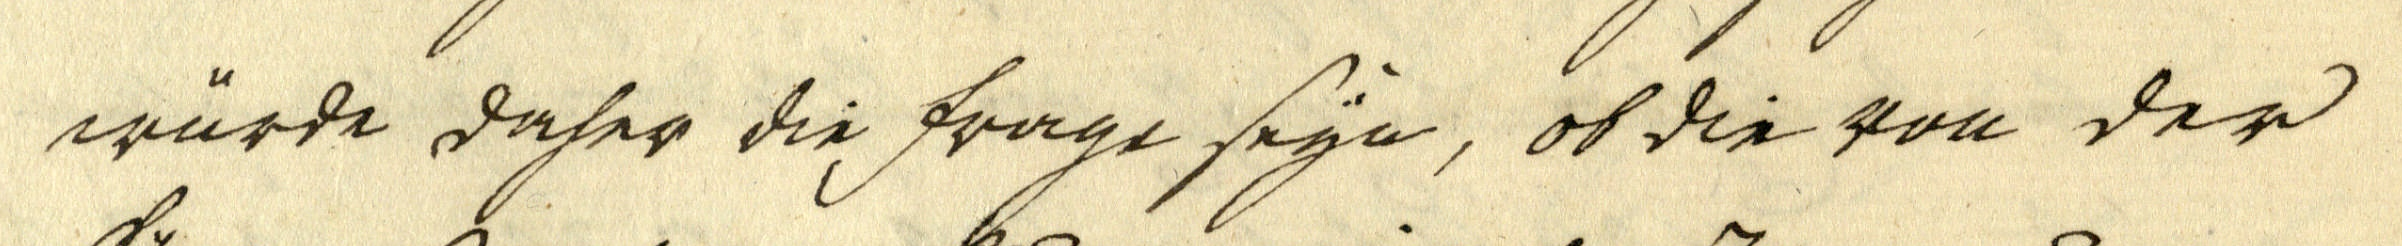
würde daher die Frage seyn, ob die von der
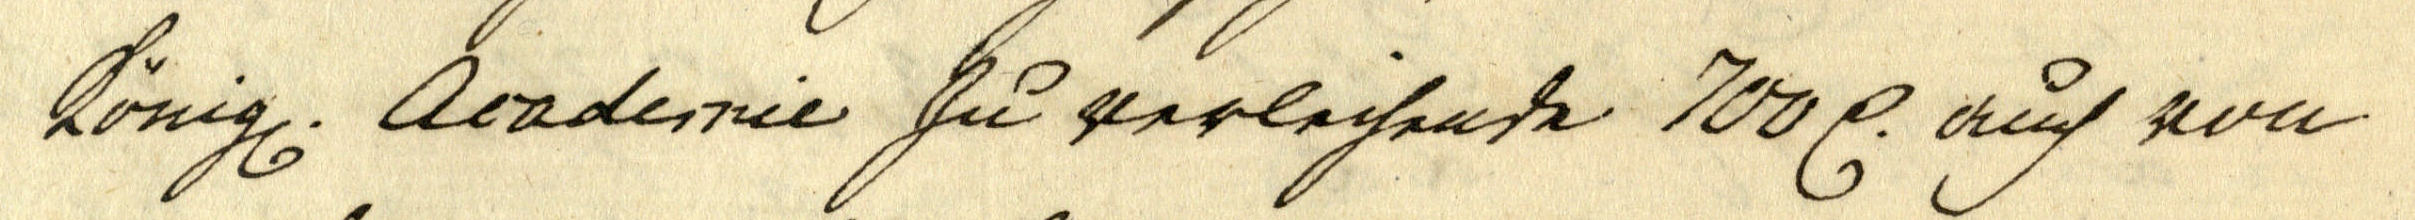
König. Academie zu verleihende 700 rtl auch von
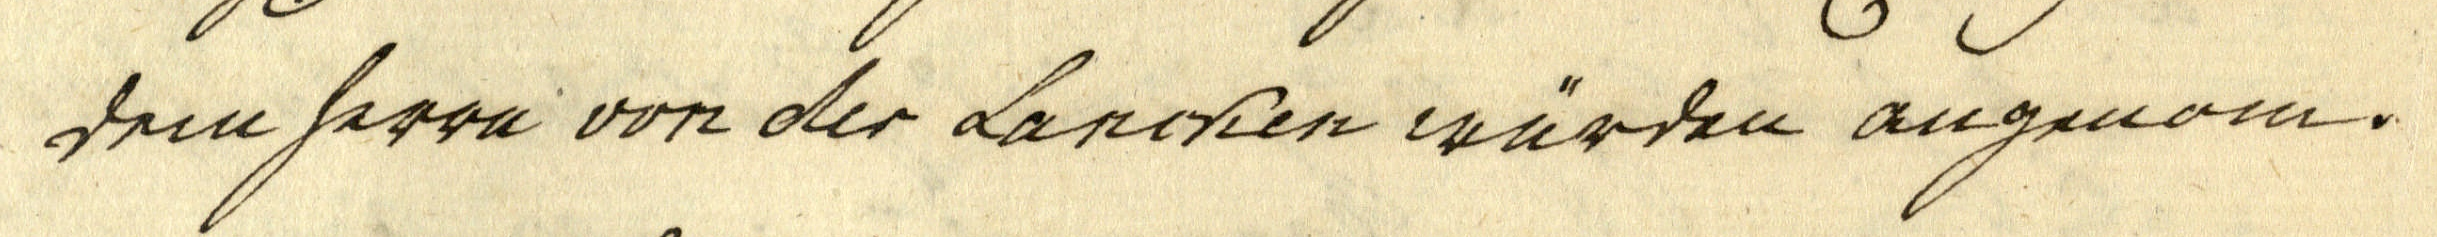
dem Herrn von der Lancken würden angenom-
